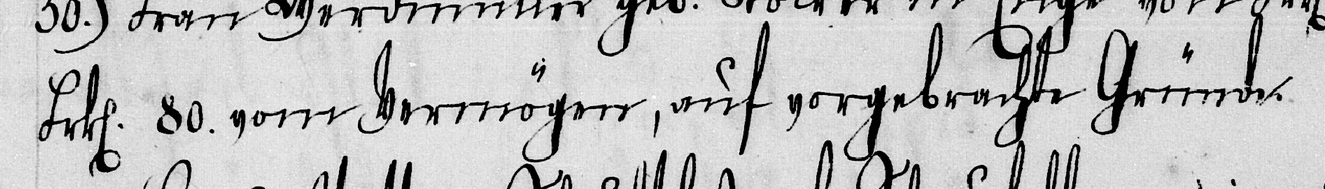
k[en]. 80. vom Vermögen, auf vorgebrachte Gründe.
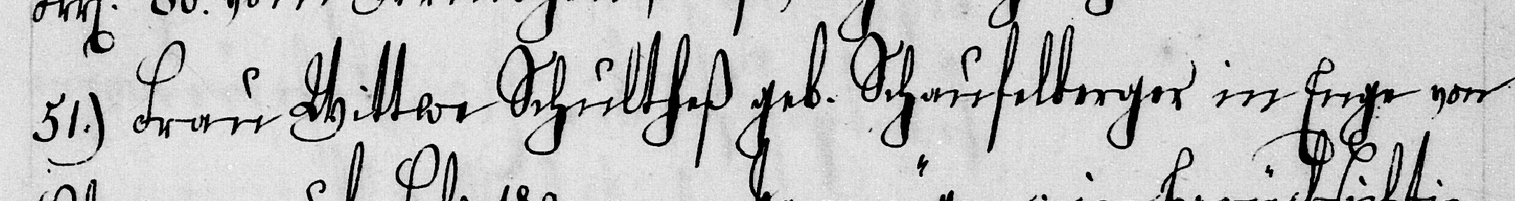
51.) Frau Wittwe Schultheß geb. Schaufelberger in Enge von
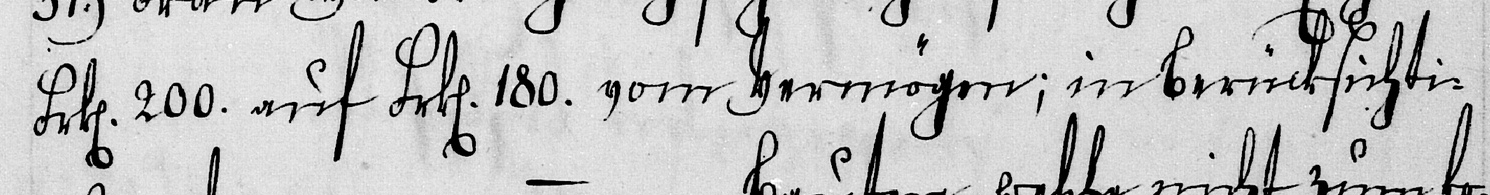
rk[en]. 200. auf Frk[en]. 180. vom Vermögen; in Berücksichti¬
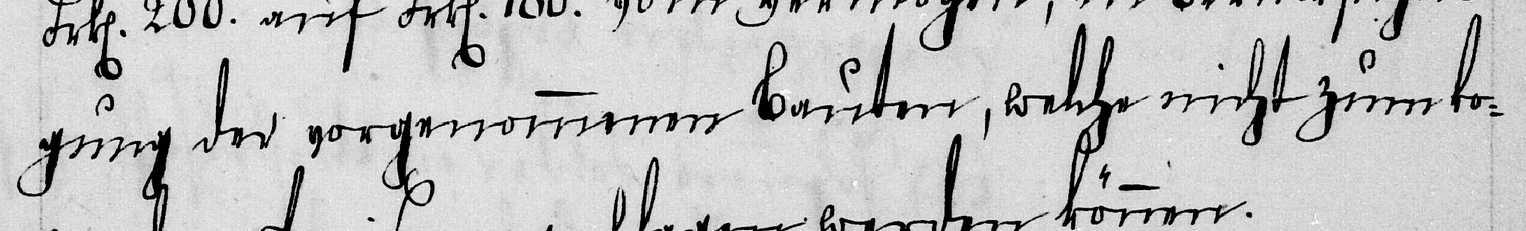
gung der vorgenommenen Bauten, welche nicht zum ko¬
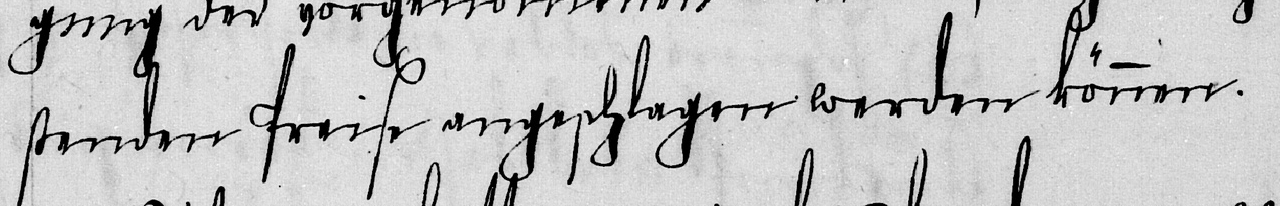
stenden Preise angeschlagen werden können.
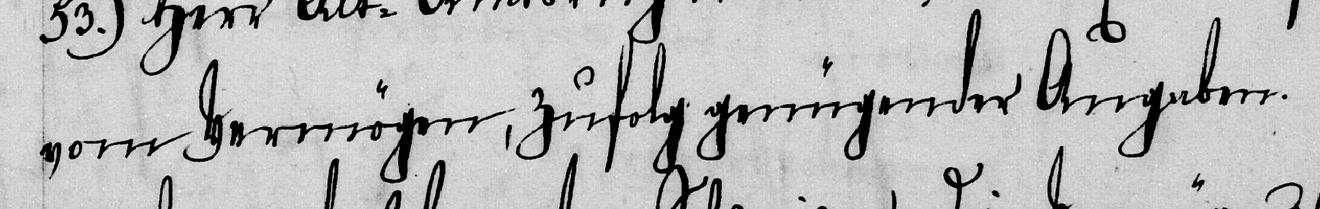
vom Vermögen, zufolg genügender Angaben.
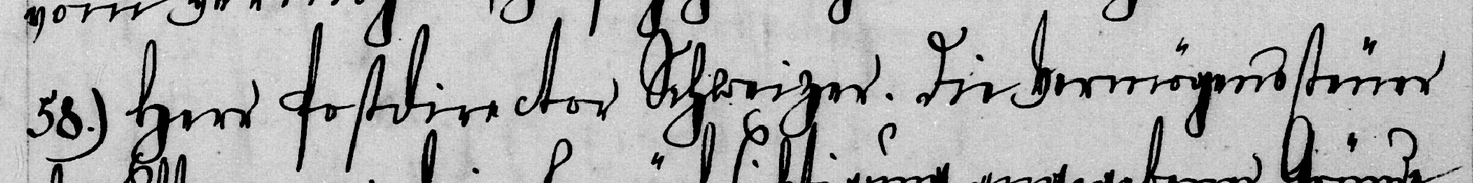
58.) Herr Postdirector Schweizer. Die Vermögenssteuer
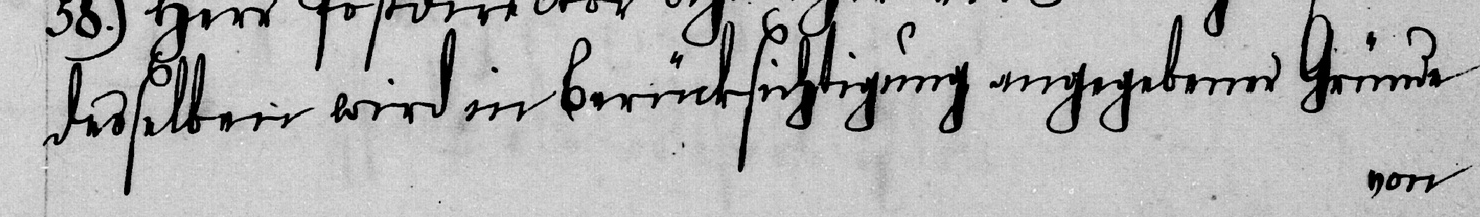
desselben wird in Berücksichtigung angegebener Gründe
